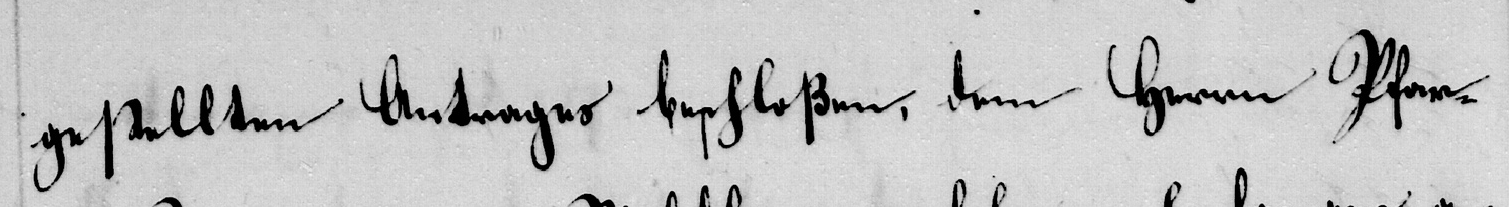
gestellten Antrages beschloßen, dem Herrn Pfar¬
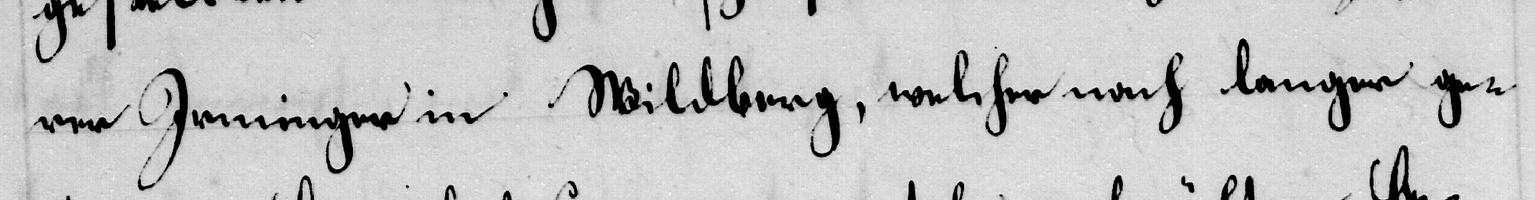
rer Irminger in Wildberg, welcher nach langer ge¬
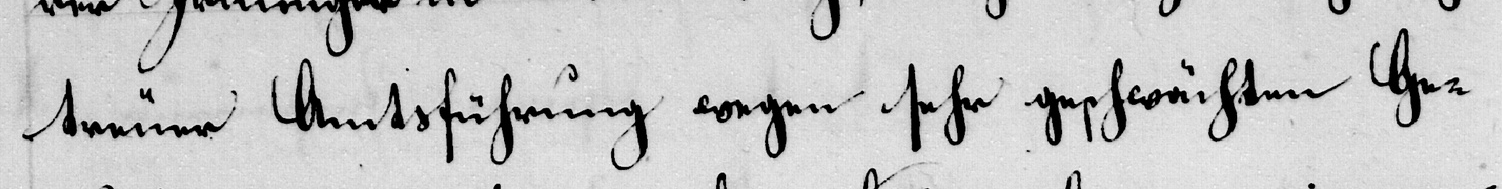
treuer Amtsführung wegen sehr geschwächten Ge¬
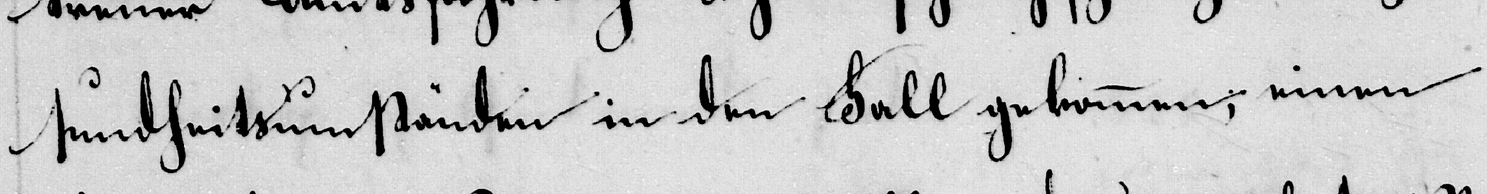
sundheitsumständen in den Fall gekommen, einen
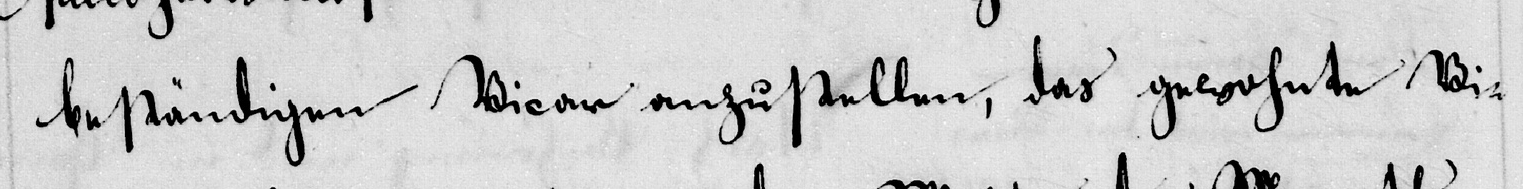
beständigen Vicar anzustellen, das gewohnte Vi¬
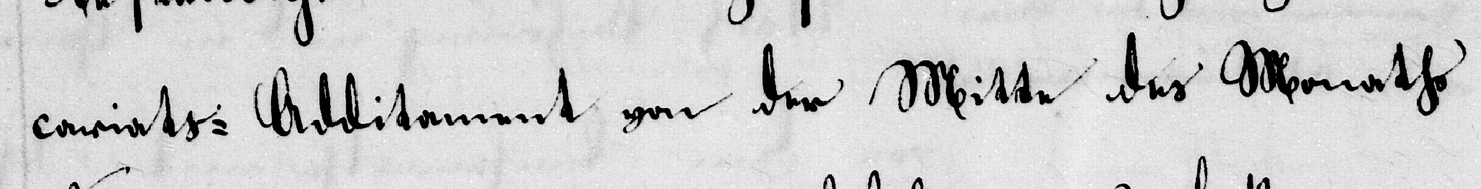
cariats-Additament von der Mitte des Monaths
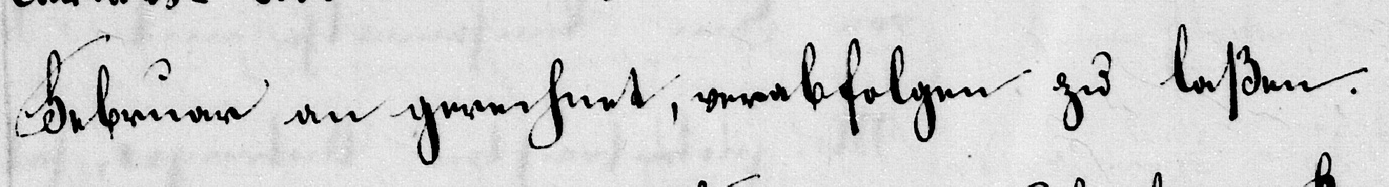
Februar an gerechnet, verabfolgen zu laßen.
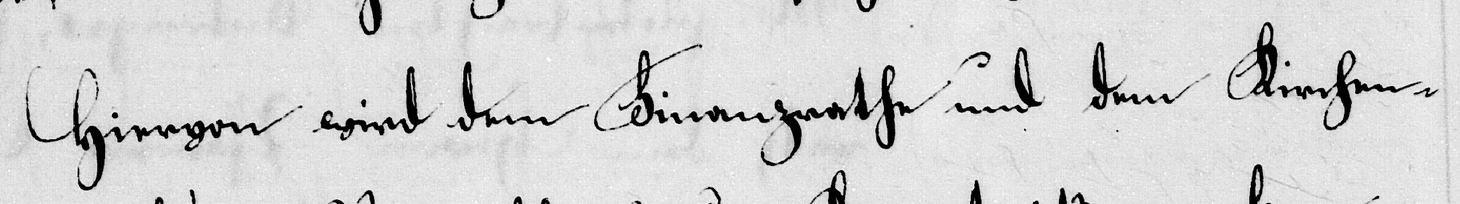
Hiervon wird dem Finanzrathe und dem Kirchen¬
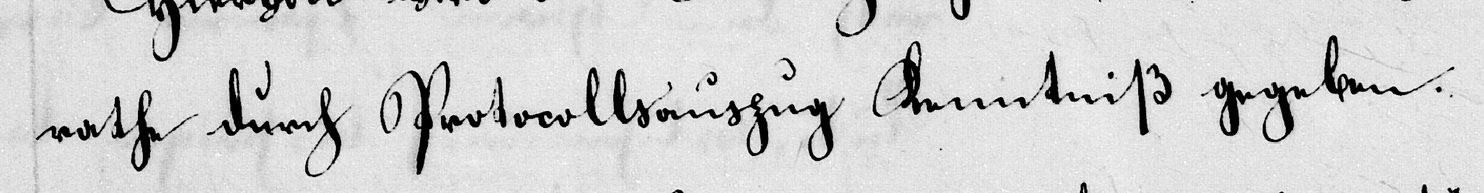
rathe durch Protocollsauszug Kenntniß gegeben.
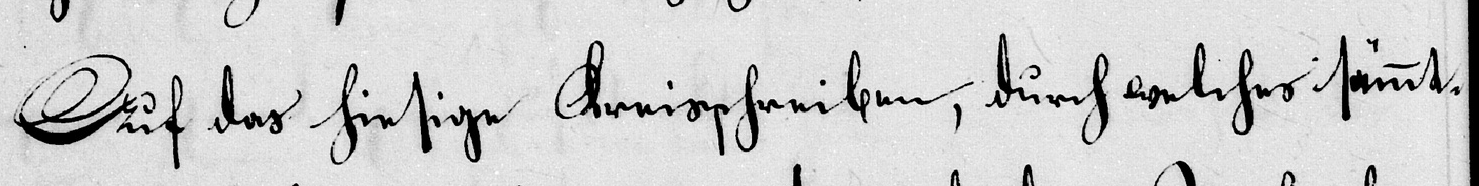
Auf das hiesige Kreisschreiben, durch welches sämmt¬
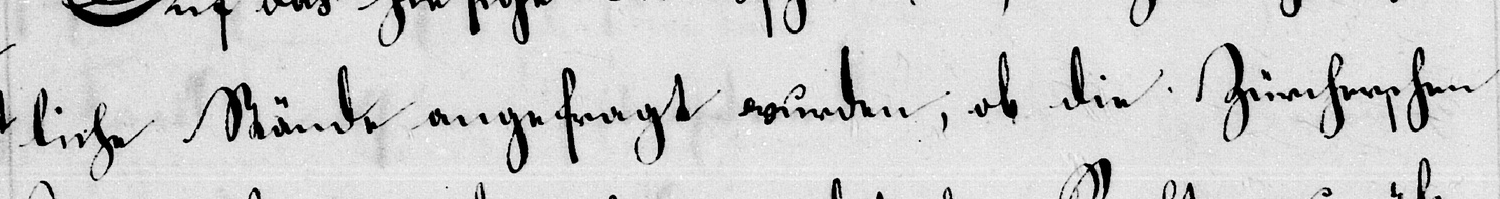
liche Stände angefragt wurden, ob die Zürcherschen
